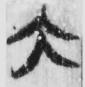大
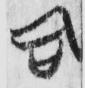司
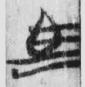馬
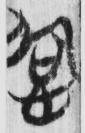○（悼）
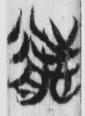○（滑）
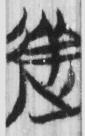𨒫（將）
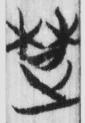楚
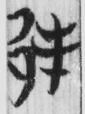邦
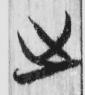之
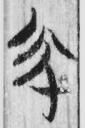帀（師）
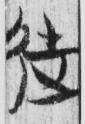徒
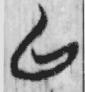㠯（以）
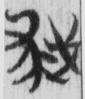○（救）
